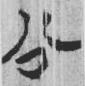公
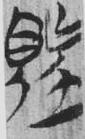○（望）
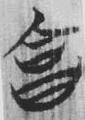○（答）
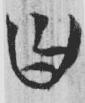曰
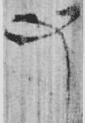又
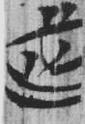武
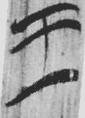王
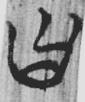曰
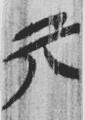亓（其）
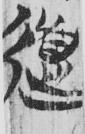道
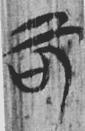可
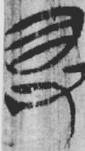𠭁
